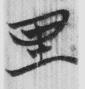里
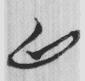㠯（以）
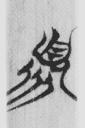須
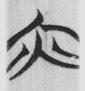亦
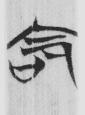命
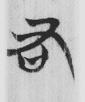右
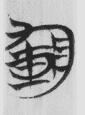軍
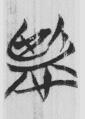監
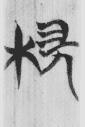{木𡵂}
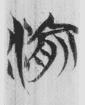渝
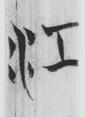江
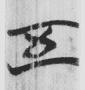五
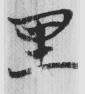里
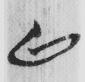㠯（以）
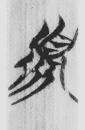須
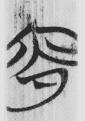{亦夕}
